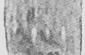六
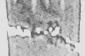十
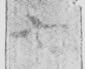七
